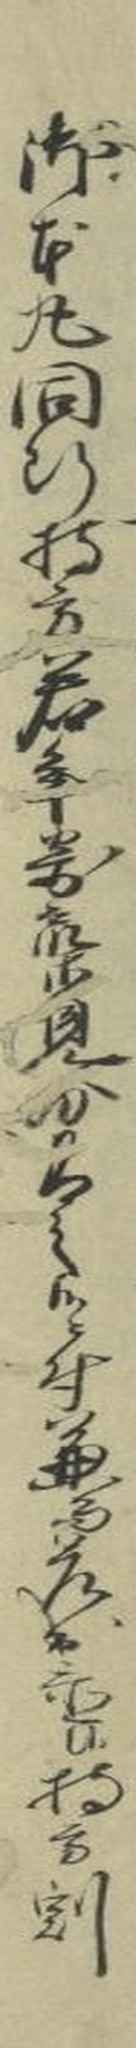一御本丸同断持方若年寄衆御見分有之候に付兼て差出置候持方割
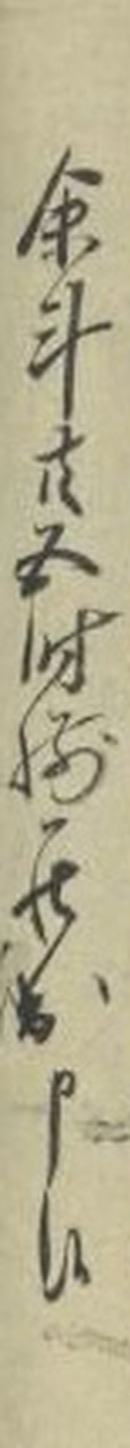余計共五時揃罷出申候
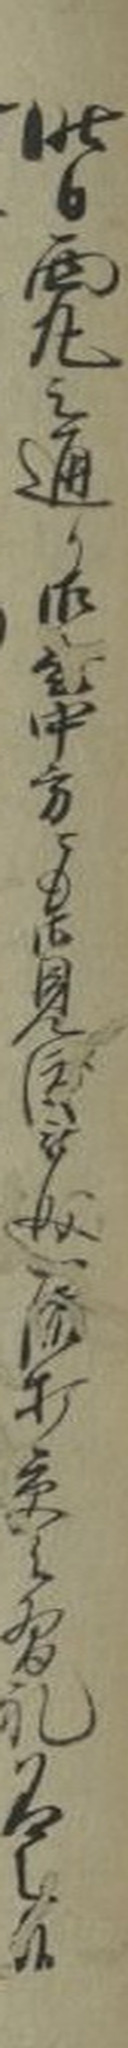一昨日西丸之通り御老中方にも御見渡被成一流打交之習礼有之候
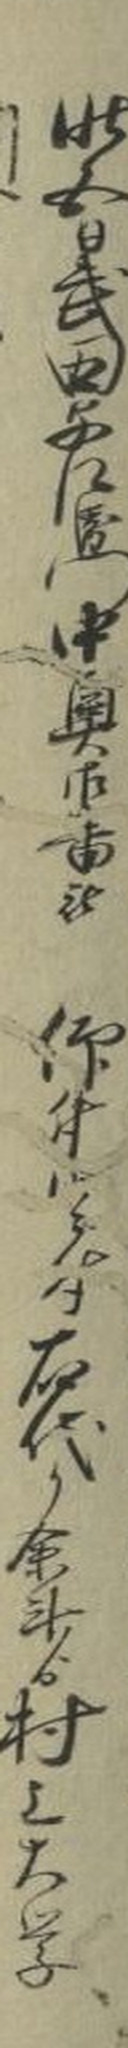一昨五日武田与左衛門中奥御番被仰付候に付右代り余計ゟ村上大学
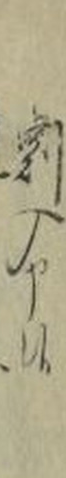割入申候
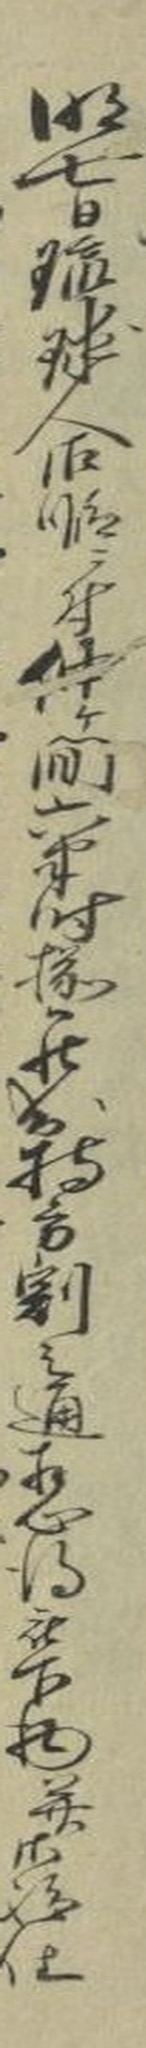一明七日琉球人御暇に付仲か間六半時揃罷出持方割之通相心得被下物并御給仕
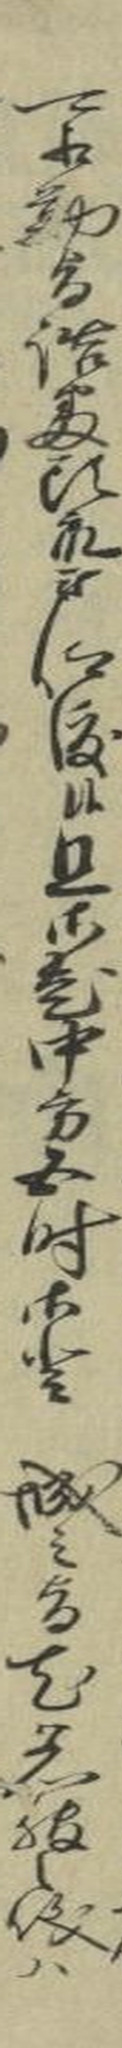可相勤旨詰番頭衆被仰渡候且御老中方五時御登城之旨尤着服之儀は
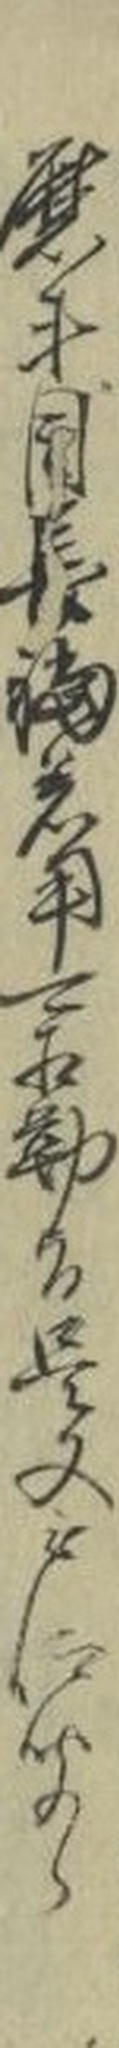熨斗目長襠着用可相勤旨是又被仰聞候
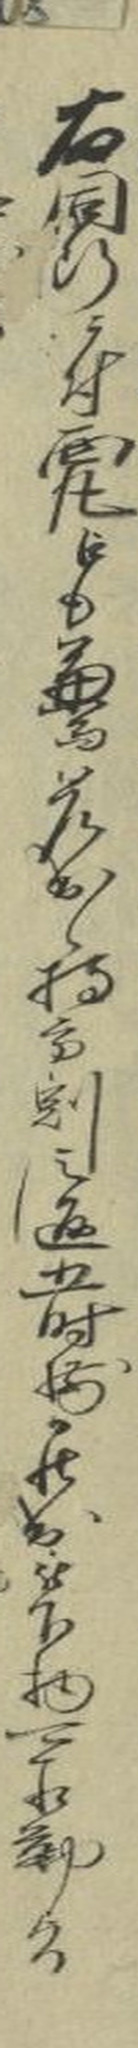一右同断に付西丸えも兼て差出候持方割之通五時揃罷出被下物可相勤旨
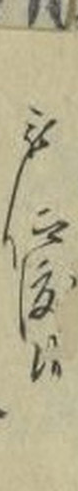被仰渡候
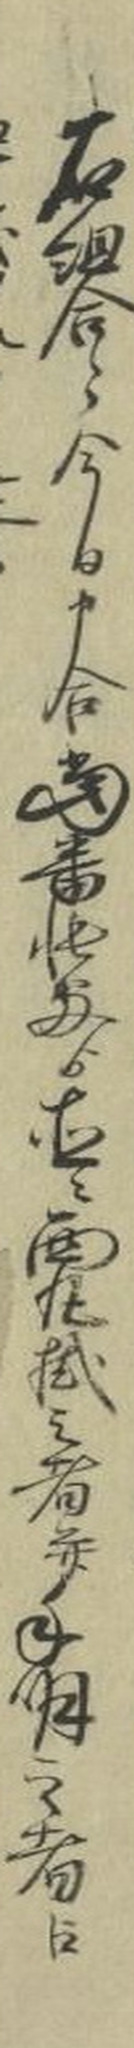右組合々今日申合当番帳番ゟ直に西丸掛之者并手明之者え
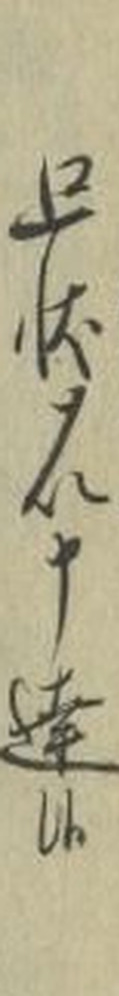廻状を以申達候
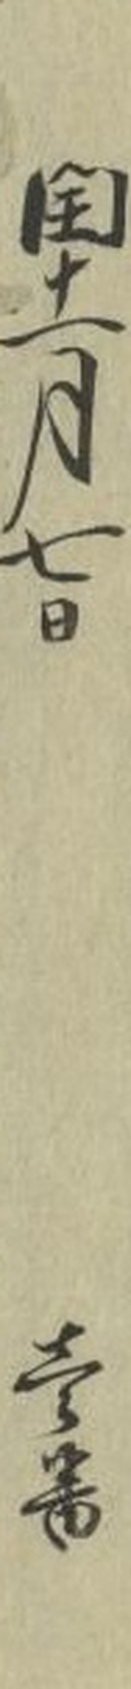閏十一月六日五番
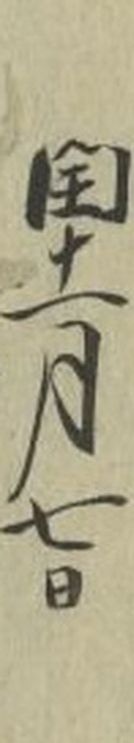閏十一月七日
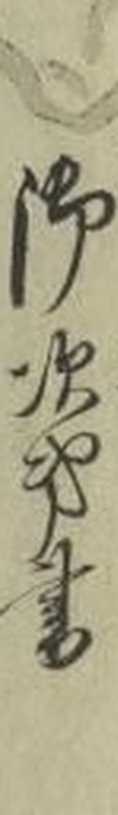御次第書
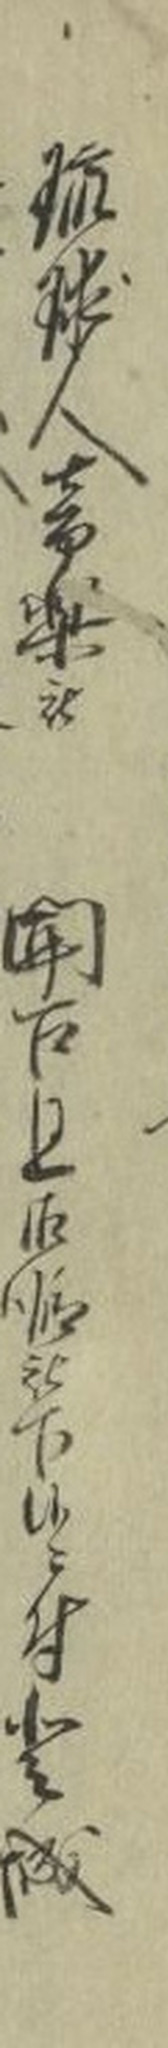一琉球人音楽被聞召且御暇被下候に付登城
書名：天保三壬辰年琉球人参府之節勤方書留
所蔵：University of the Ryukyus Library
